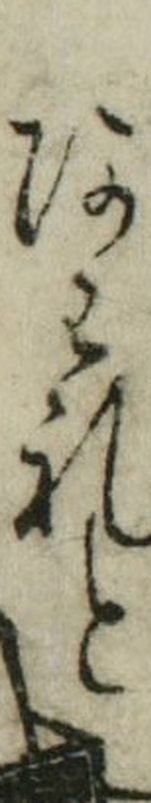あわれと
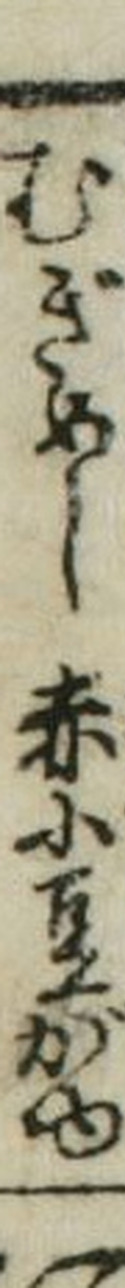むぎめし赤小豆がゆ
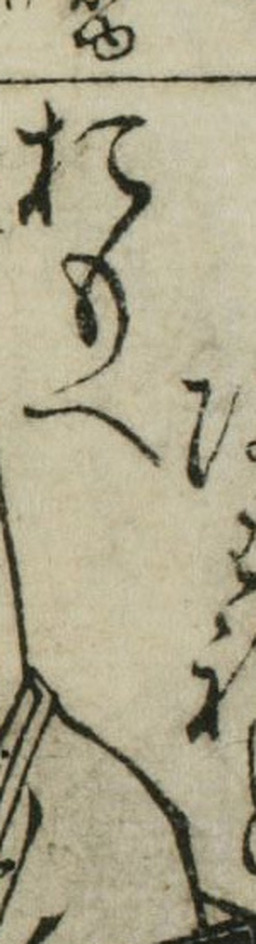おもへ
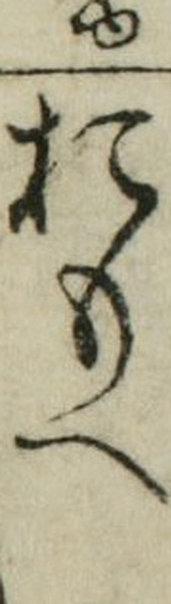おもへ
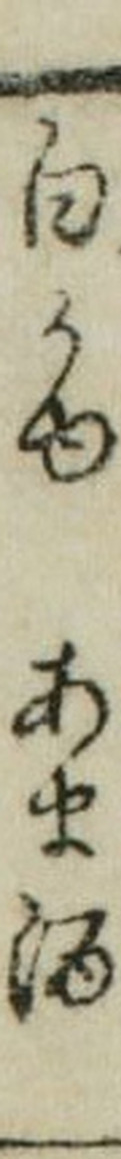白かゆあま酒
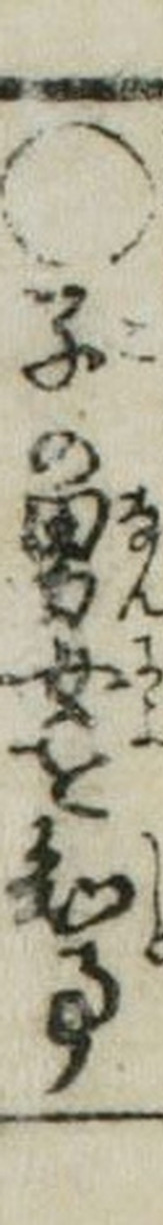○子の男女を知事
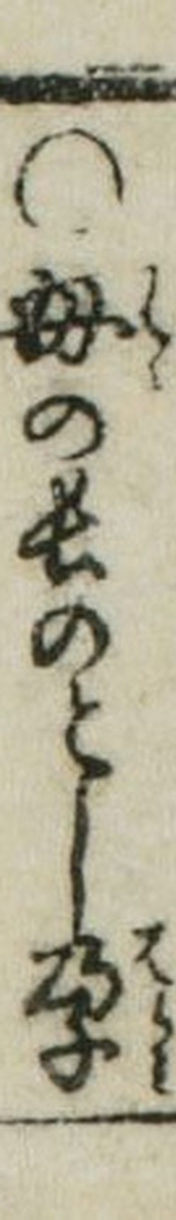○母の長のとし孕
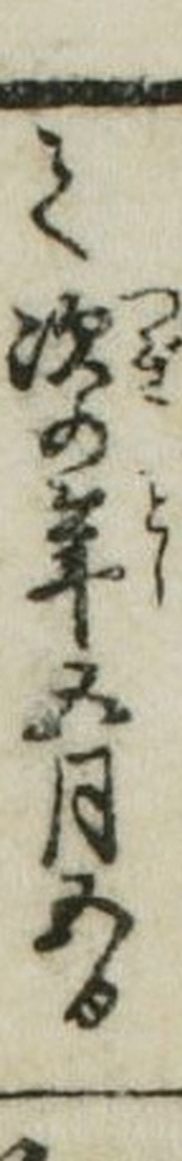て次の年五月五日
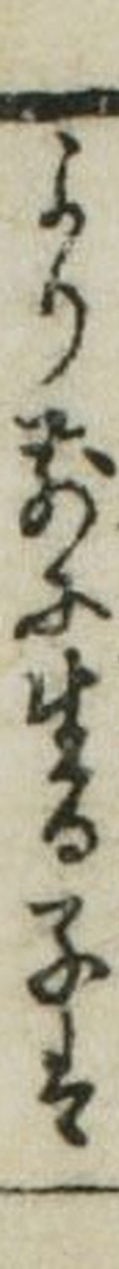より前に生る子は
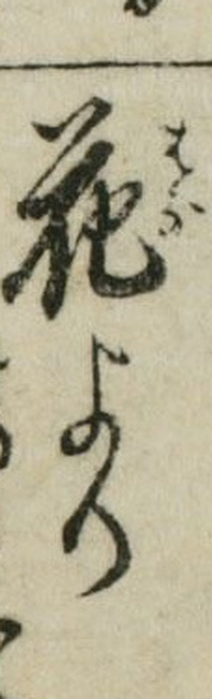花より
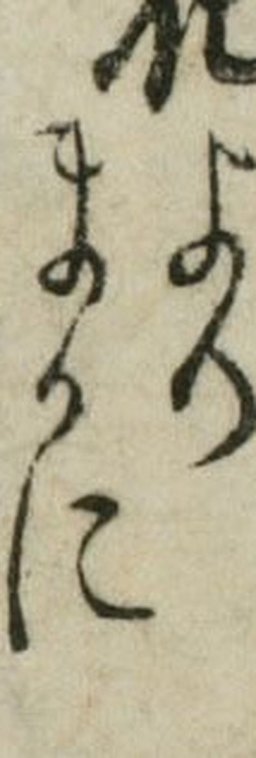ほかに
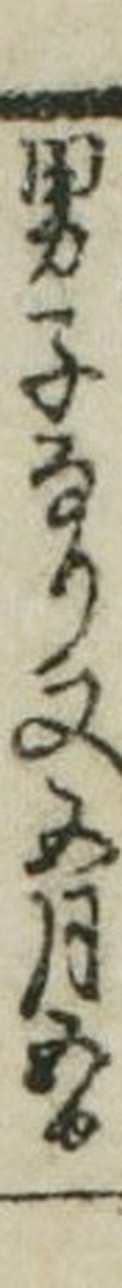男子なり又五月五日
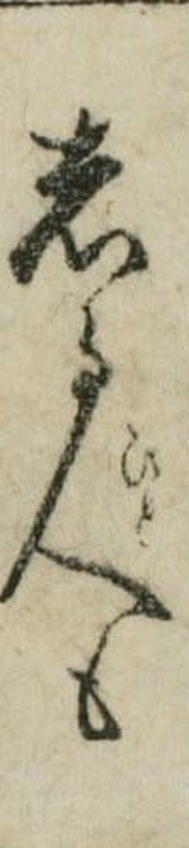しる人も
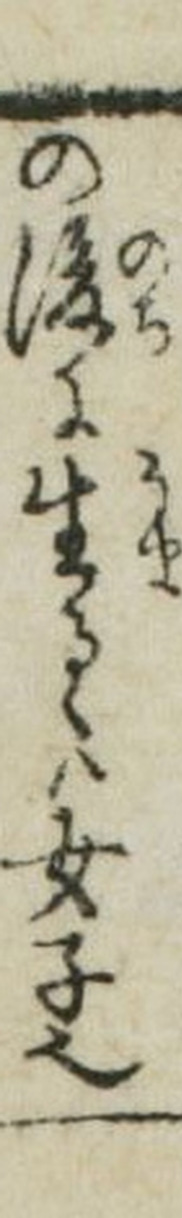の後に生るゝは女子也
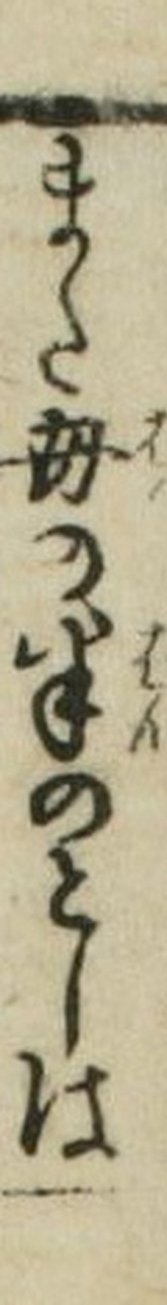また母の半のとしは
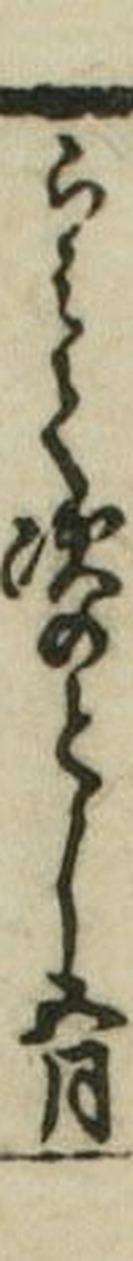らみてつ次のとし五月
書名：百人一首
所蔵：東京学芸大学教育コンテンツアーカイブ
